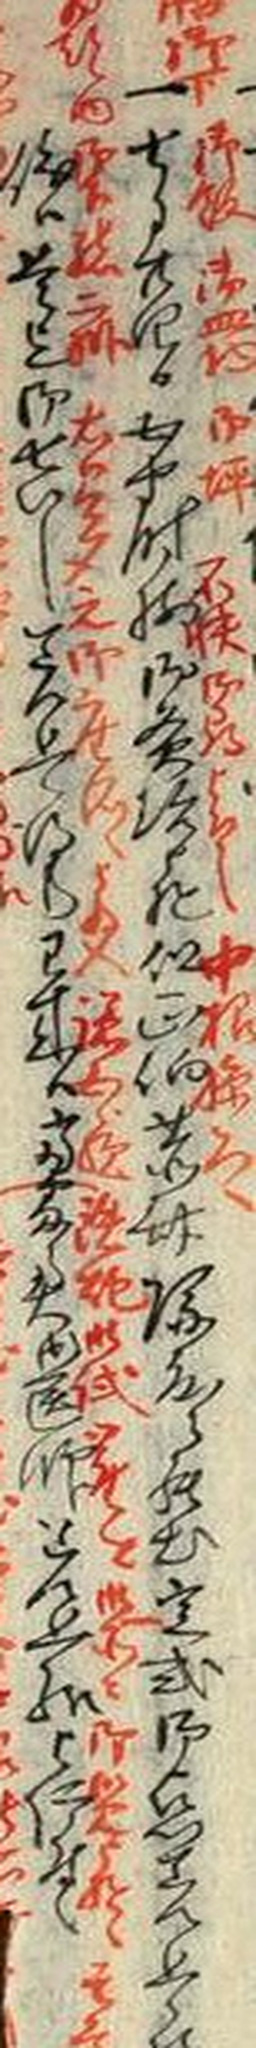儀ハ是迄御匙いし差上候得共已来ハ当番奥御医師差上候様被仰付候
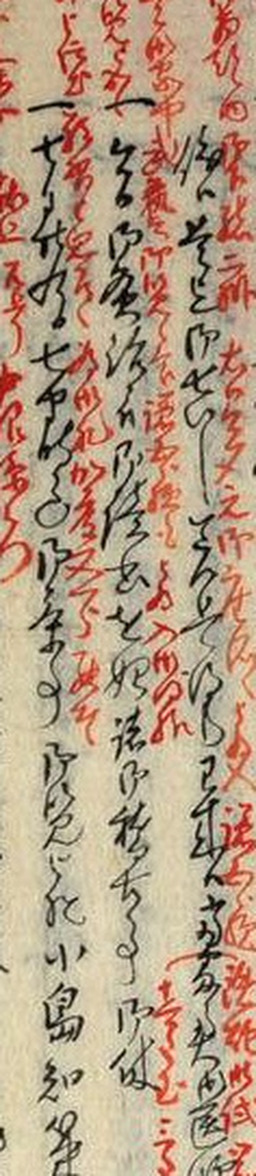一今日御灸治ニ付御読書を始諸御稽古事御休
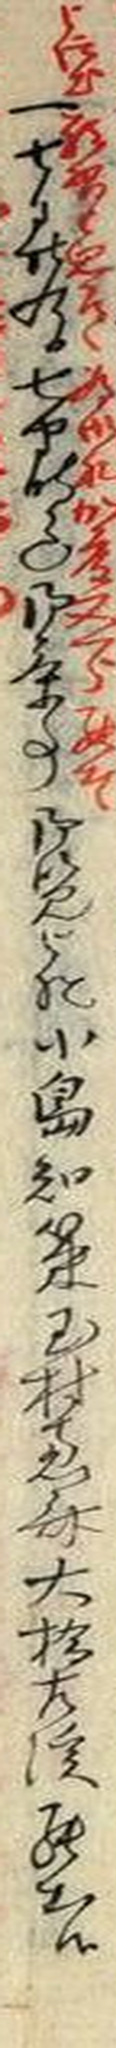一七月廿九日七半時過御茶事御覧被遊小島知策玉村恵斎大橋左渓罷出候
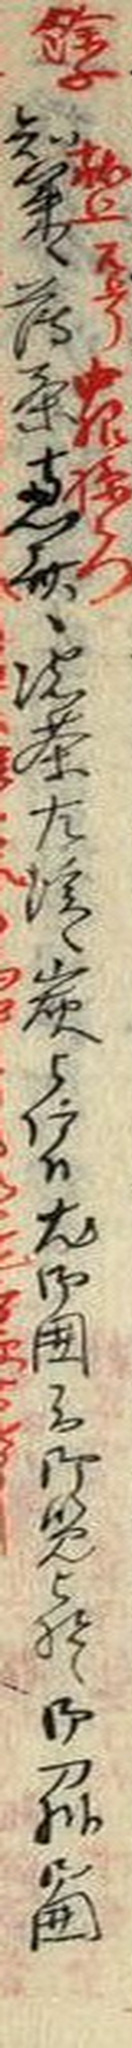知策へ薄茶恵斎へ濃茶左渓へ炭被仰付尤御囲ニ而御覧被遊候御刀掛御囲
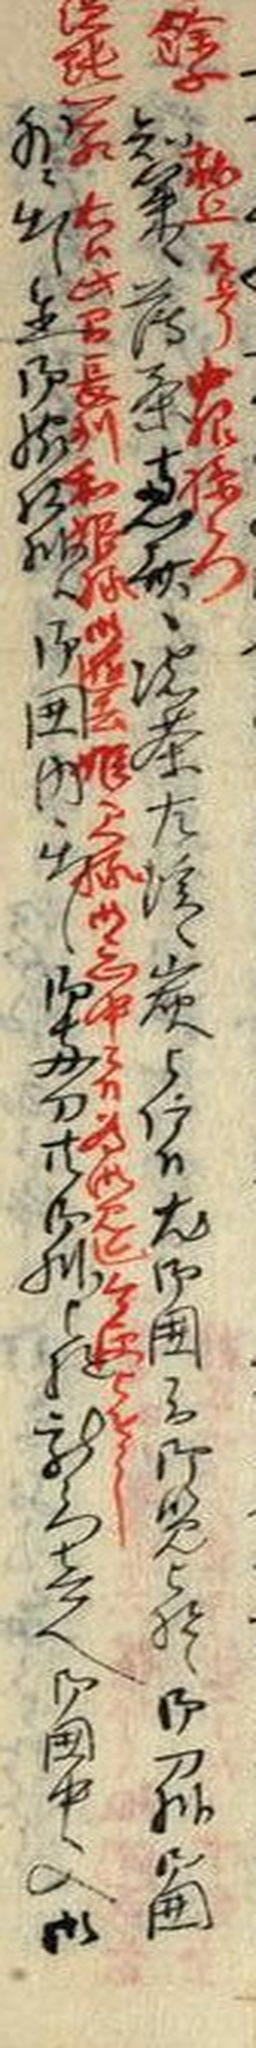外ニ出し置御脇指掛ハ御囲内へ出し御両刀共御掛被遊新右衛門壱人御囲中へ入御

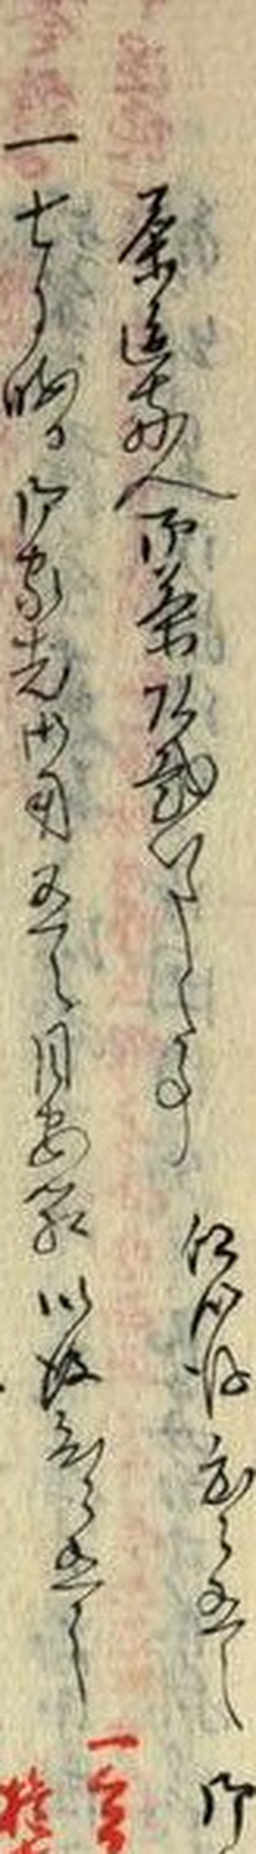一七月晦日御家老御用有之目安箱以後度々有之
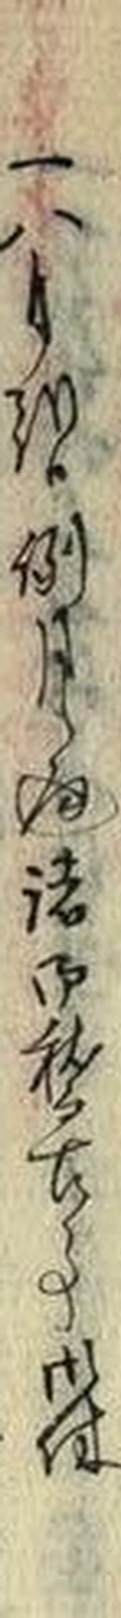一八月朔日例月之通諸御稽古事御休
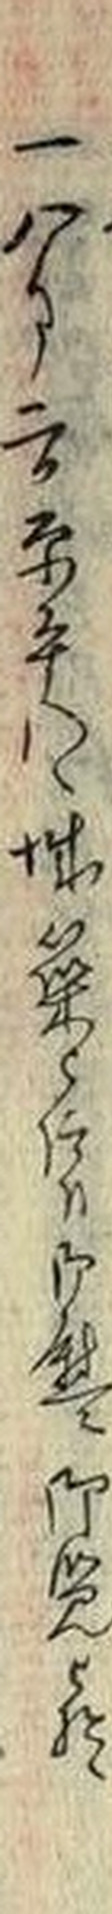一八月二日原平八へ城築被仰付御慰ニ御覧被遊候
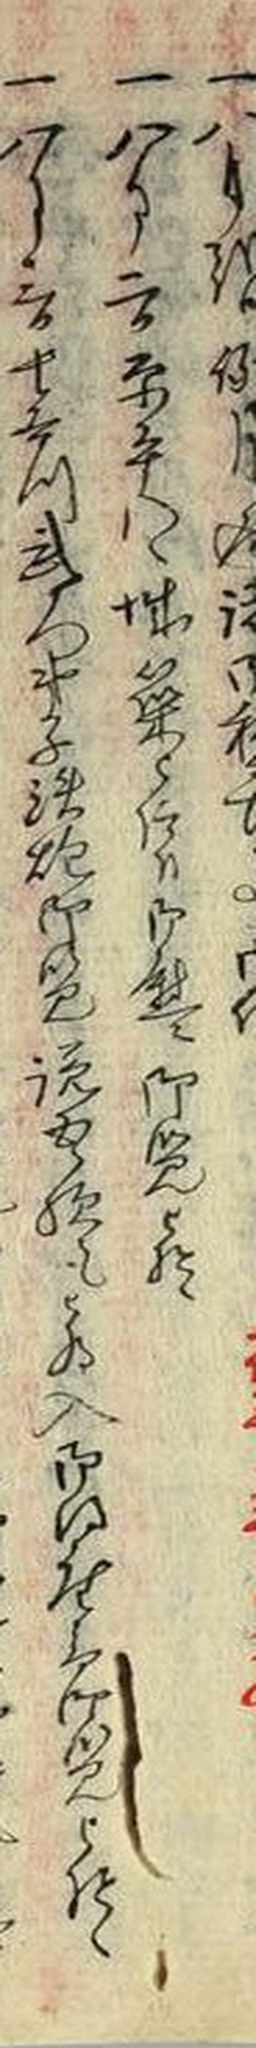一八月三日長谷川武右衛門弟子鉄炮御覧謙五郎様ニも被為入御同座ニ而御覧被遊候
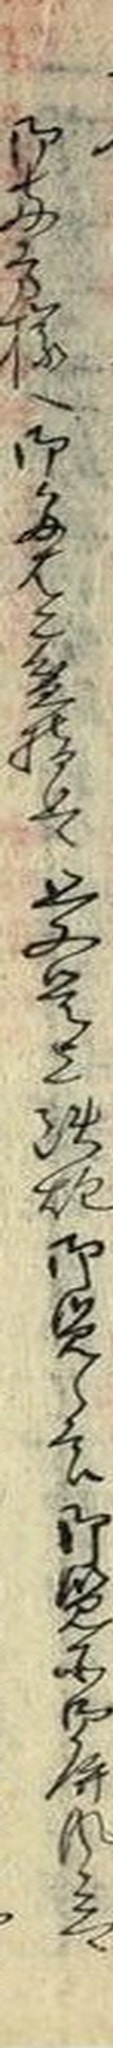御両方様へ御たはこ盆指上候且又是迄鉄炮御覧之節御覧所御屛風立候
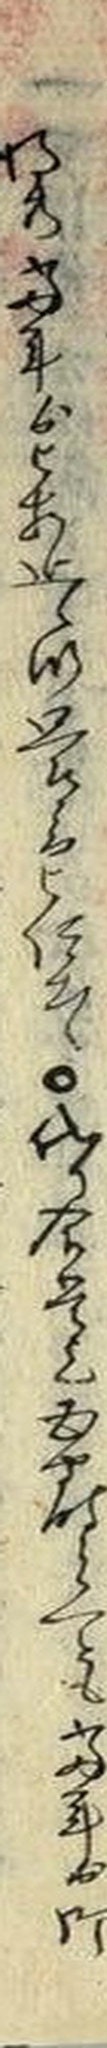得共当年ゟ被相止候段思召ニ而被仰出候〇代り合是迄五半時ニ候へとも当年ゟ御
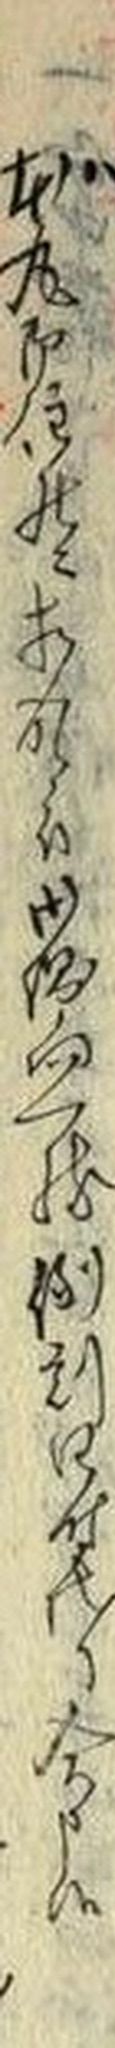本丸御住居ニ相成候ニ付御側向一統例刻四時代り合申候
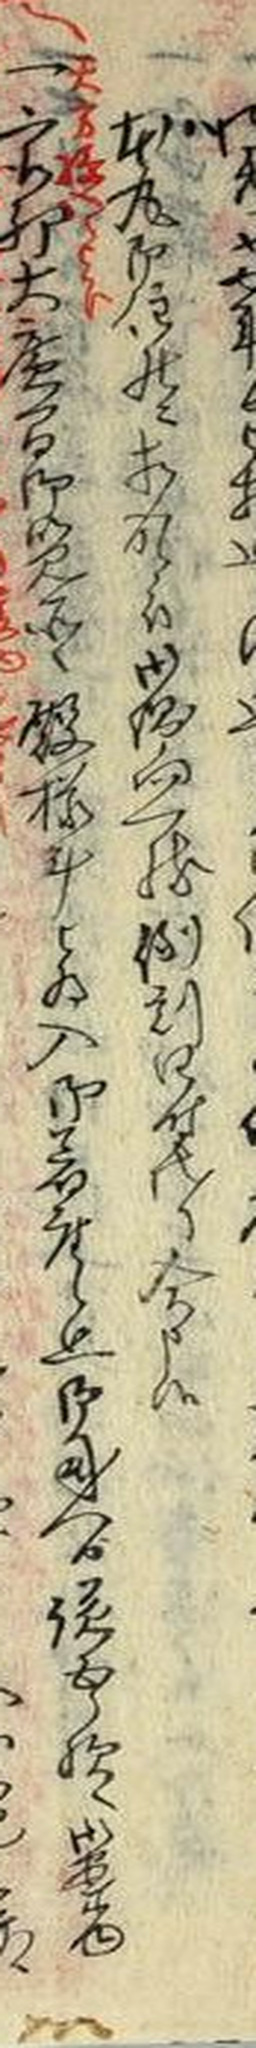一最初大広間御覧所へ殿様斗被為入御着座之上御用人ゟ謙五郎様へ御案内
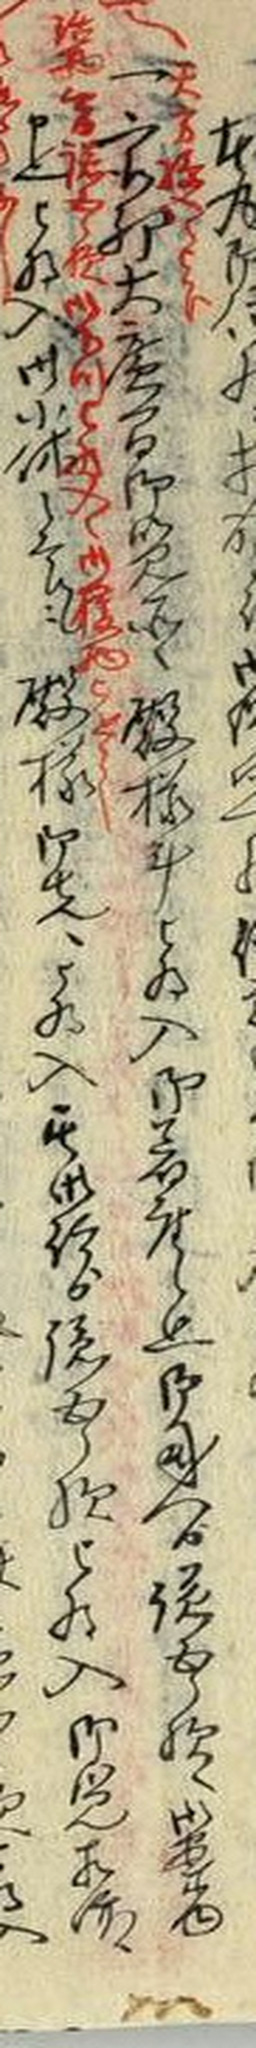申上被為入御小休之節も殿様御先へ被為入其御跡ゟ謙五郎様被為入御覧相済候
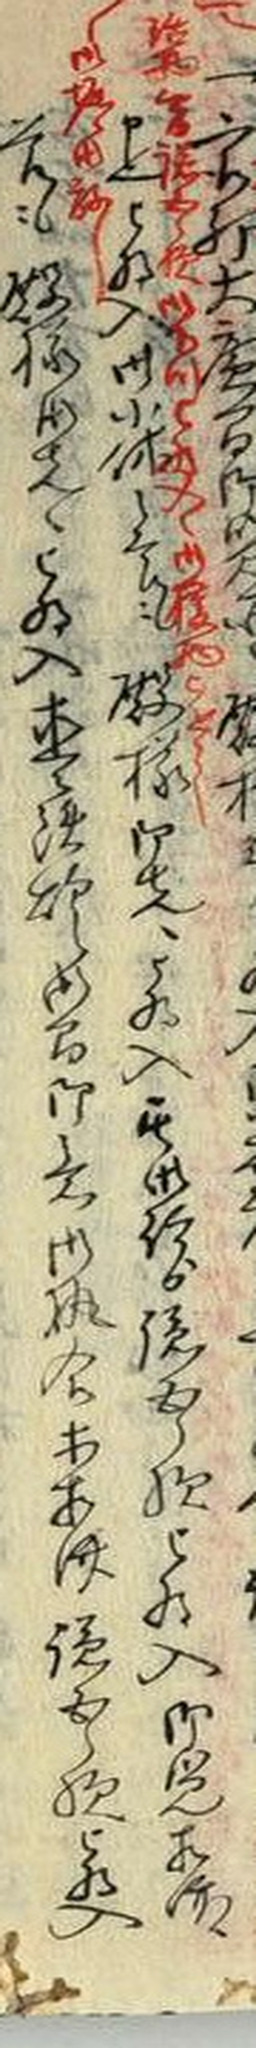節も殿様御先へ被為入直ニ鉄炮之御間御意御執合等相済謙五郎様被為入
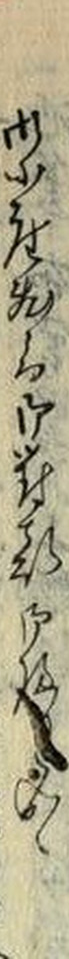御小座敷ニ而御対顔御帰り被成候
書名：少傅日録抄（斉承付側向頭取日記、在国）
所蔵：福井県文書館 Fukui Prefectural Archives
